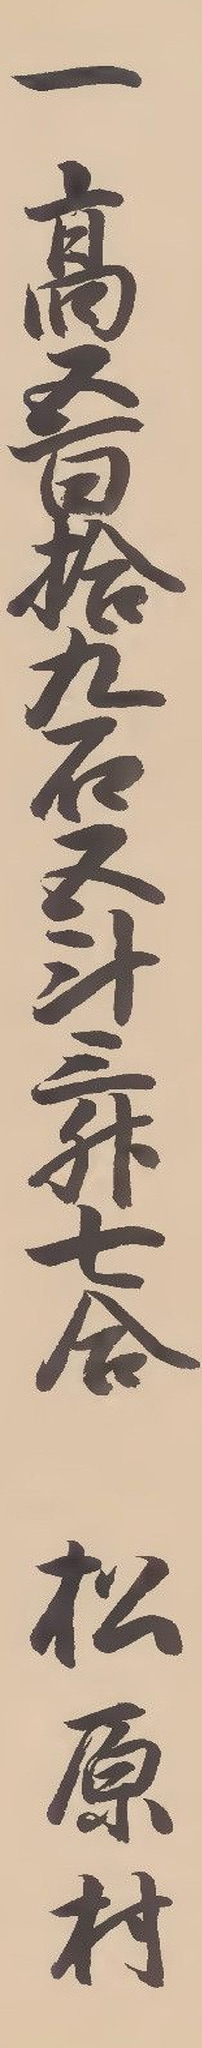一高五百拾九石五斗三升七合松原村
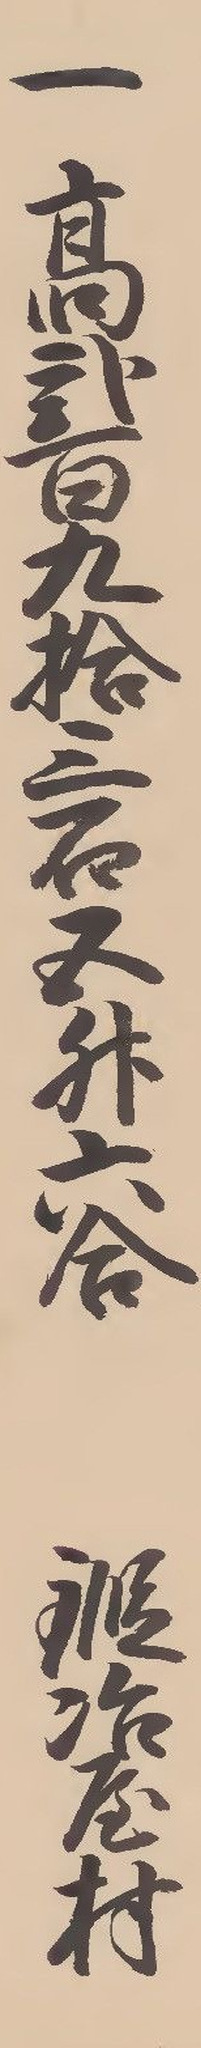一高弐百九拾三石五升六合鍛冶屋村

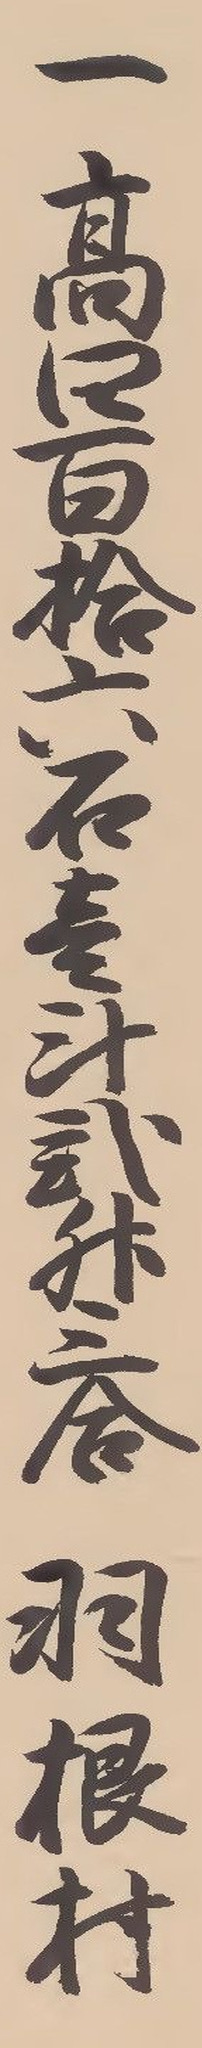一高四百拾六石壱斗弐升三合羽根村
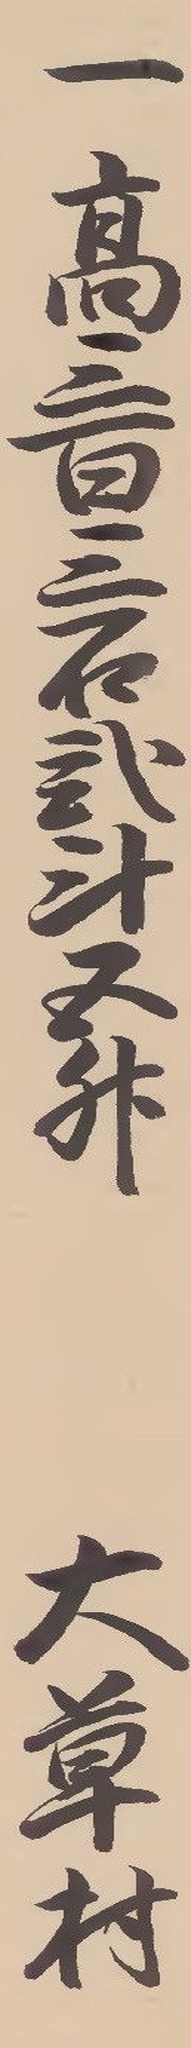一高三百三石弐斗五升大草村
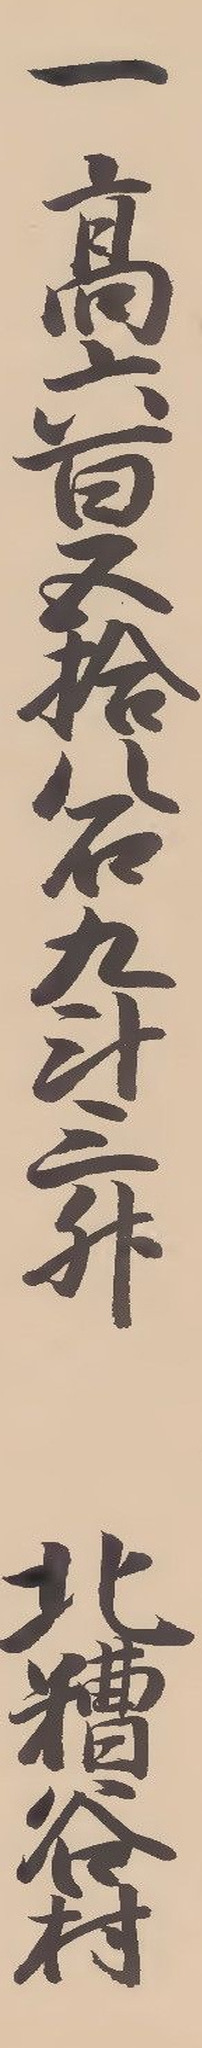一高六百五拾八石九斗三升北糟谷村
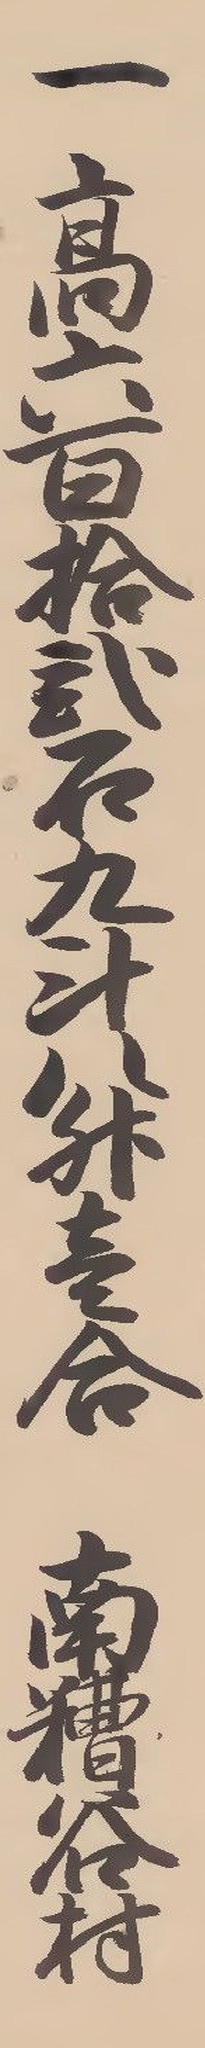一高六百拾弐石九斗八升壱合南糟谷村
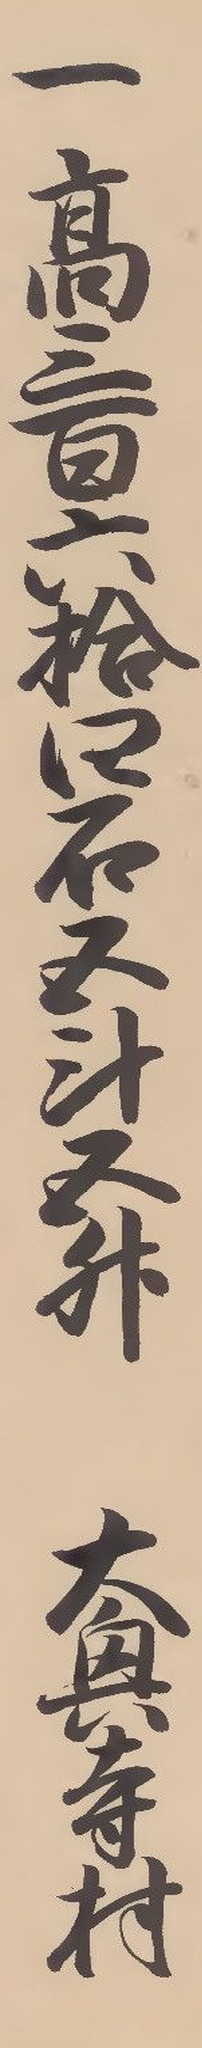一高三百六拾四石五斗五升大興寺村
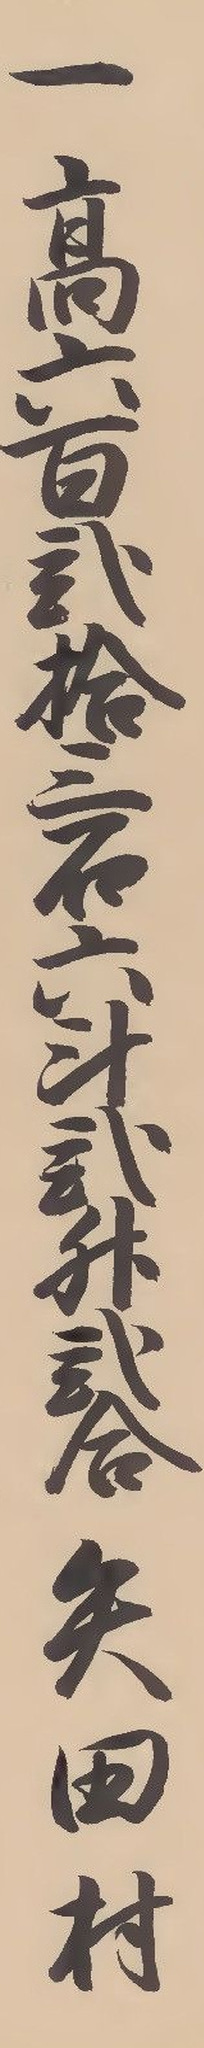一高六百弐拾三石六斗弐升弐合矢田村
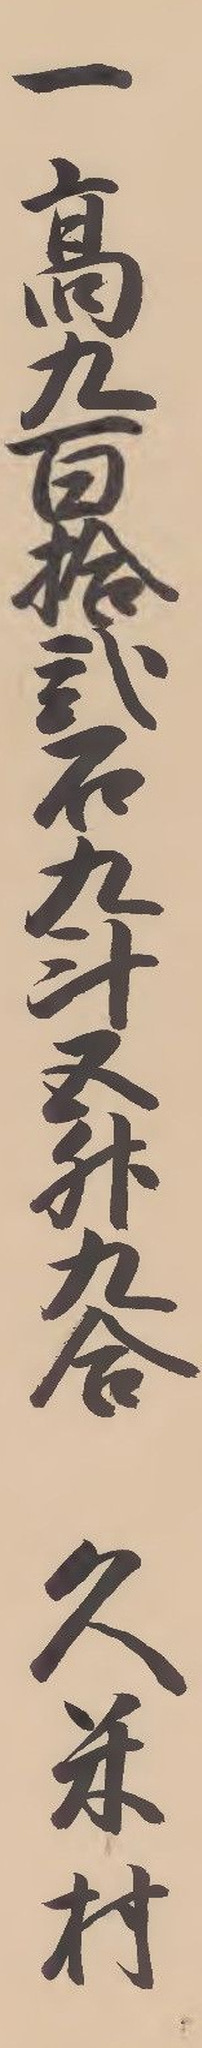一高九百拾弐石九斗五升九合久米村
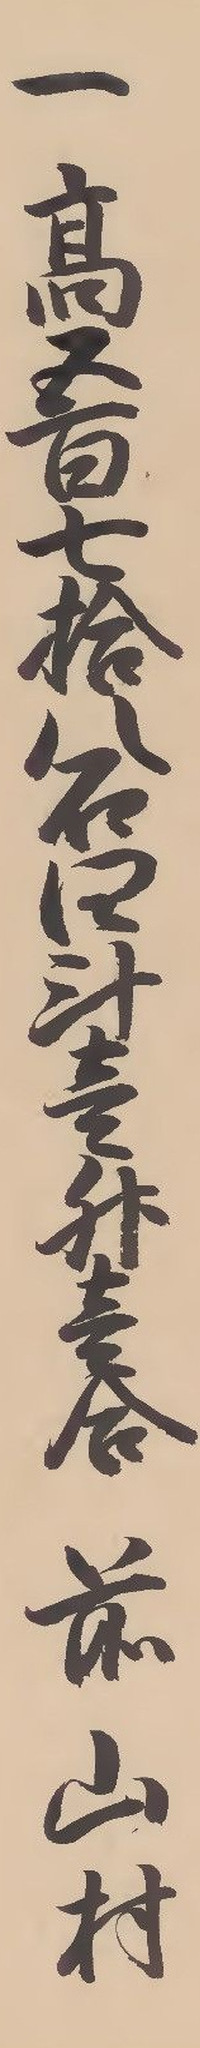一高五百七拾八石四斗壱升壱合前山村

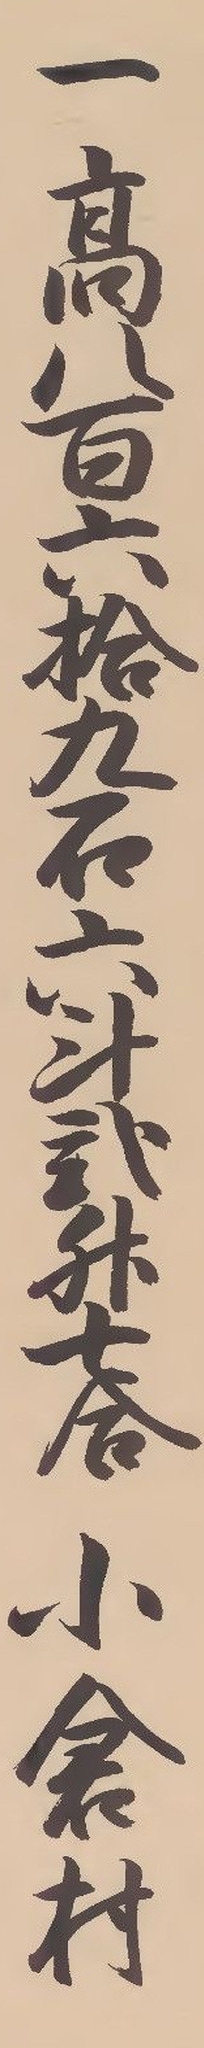一高八百六拾九石六斗弐升七合小倉村
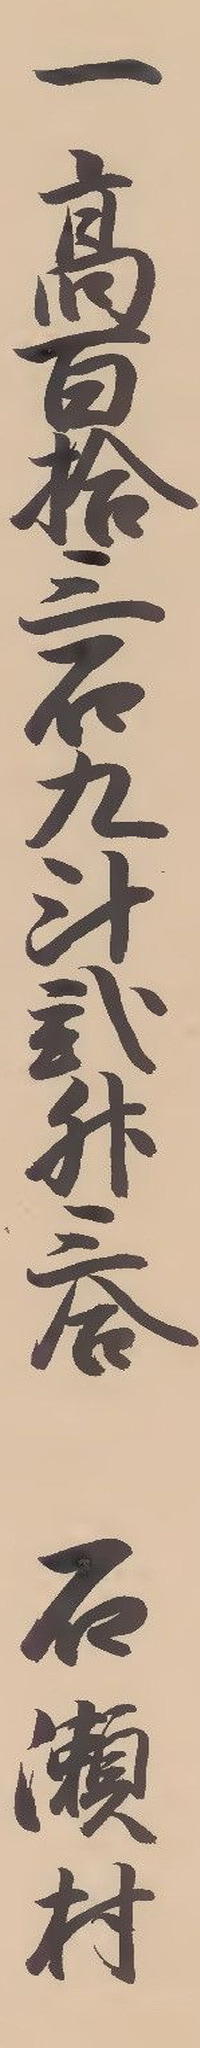一高百拾三石九斗弐升三合石瀬村
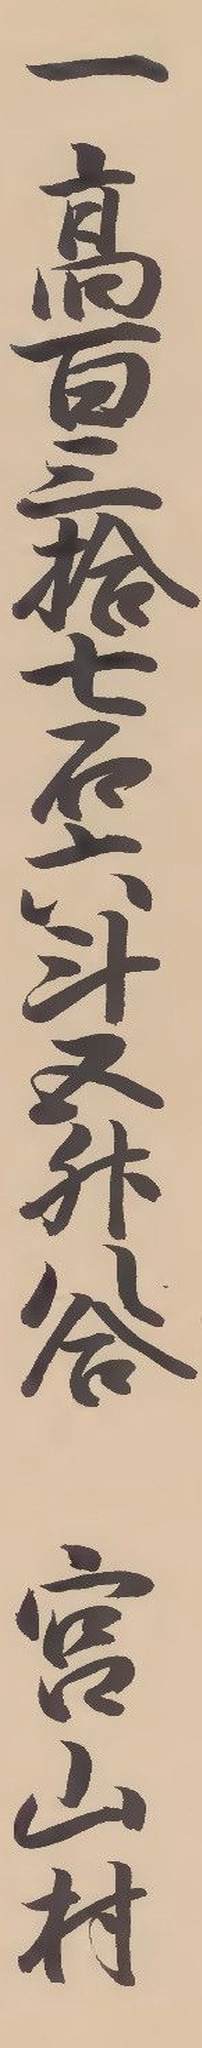一高百三拾七石六斗五升八合宮山村
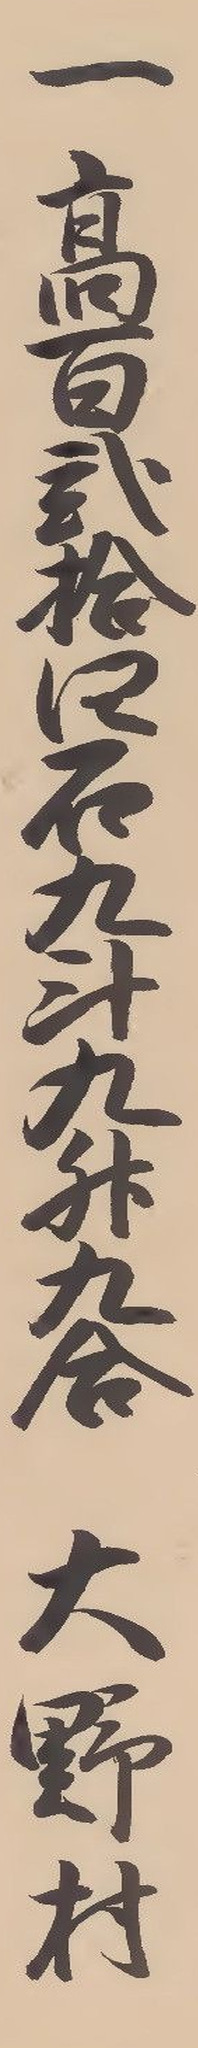一高百弐拾四石九斗九升九合大野村
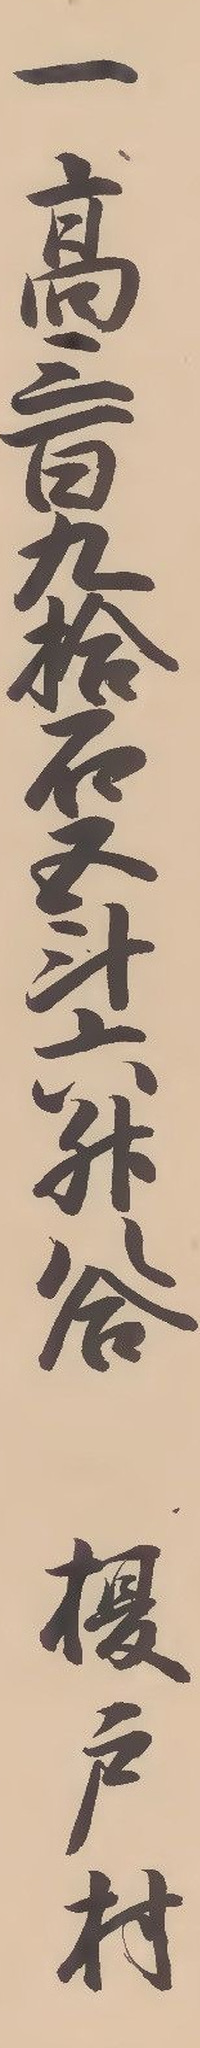一高三百九拾石五斗六升八合榎戸村
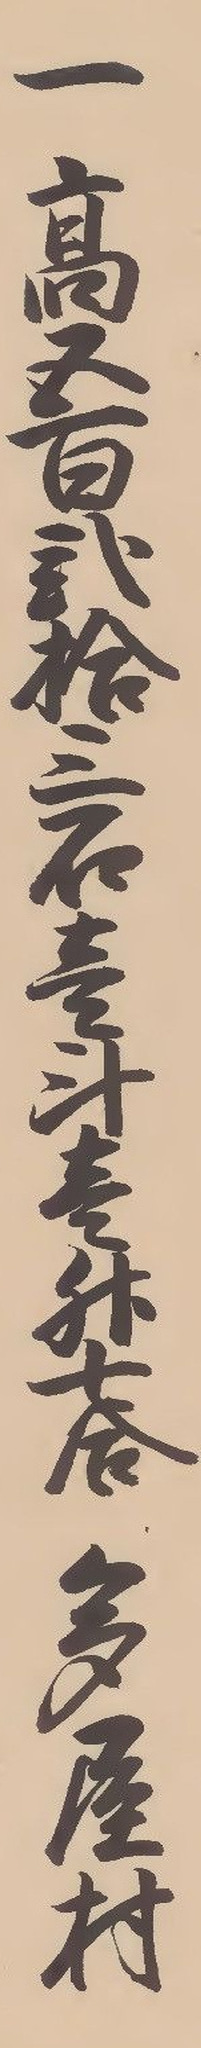一高五百弐拾三石壱斗壱升七合多屋村
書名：尾張国郷帳
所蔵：国立公文書館 National Archives of Japan
